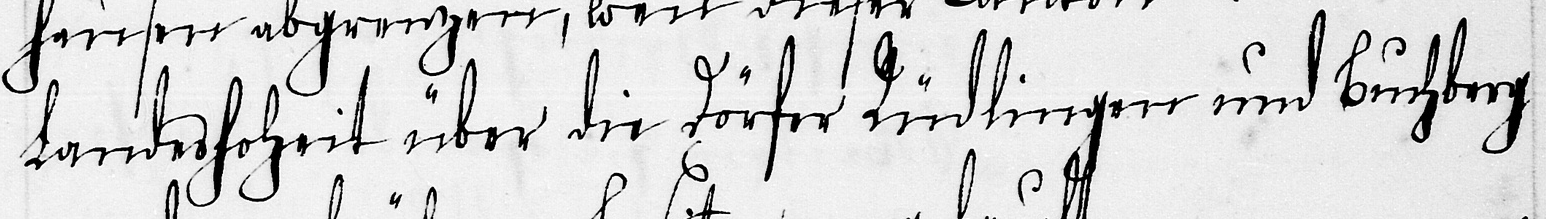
Landeshoheit über die Dörfer Rüdlingen und Buchberg
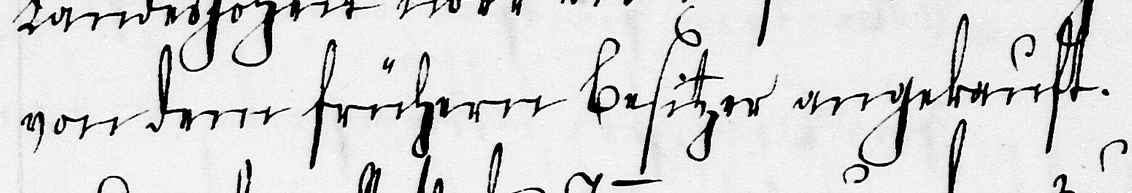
von dem frühern Besitzer angekauft.
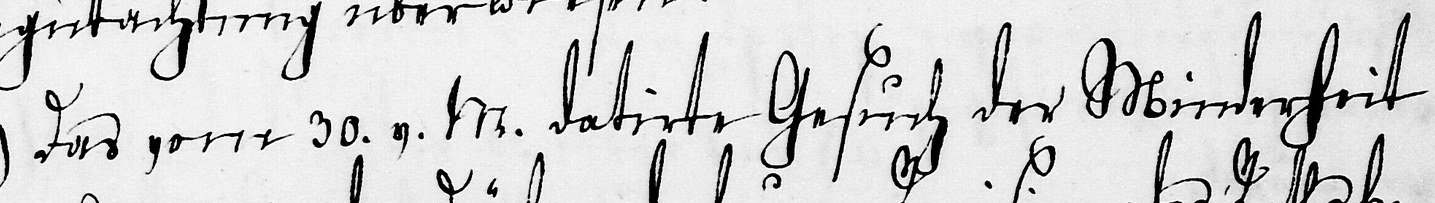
Das vom 30. v. M. datirte Gesuch der Minderheit
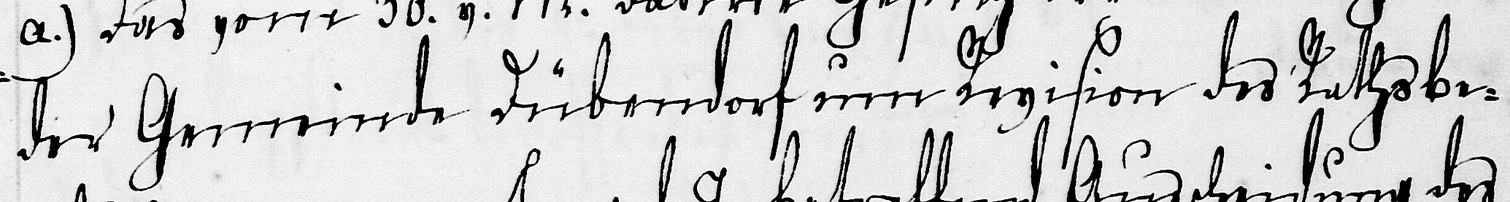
der Gemeinde Dübendorf um Revision des Rathsbes¬
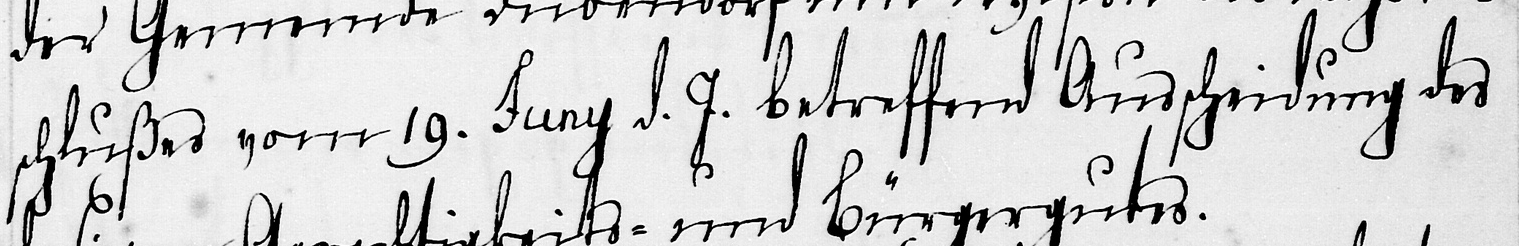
chlußes vom 19. Juny d. J. betreffend Ausscheidung des
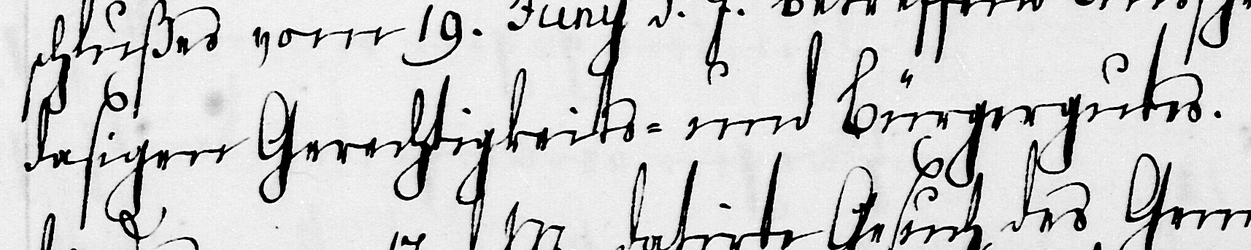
dasigen Gerechtigkeits- und Bürgergutes.
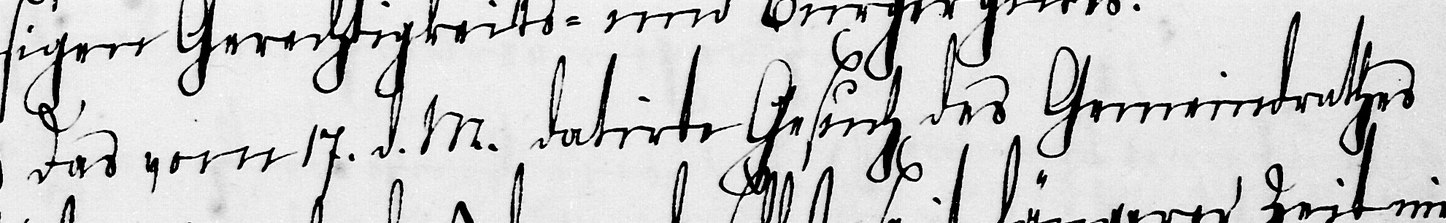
Das vom 17. d. M. datirte Gesuch des Gemeindrathes
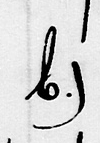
b.)
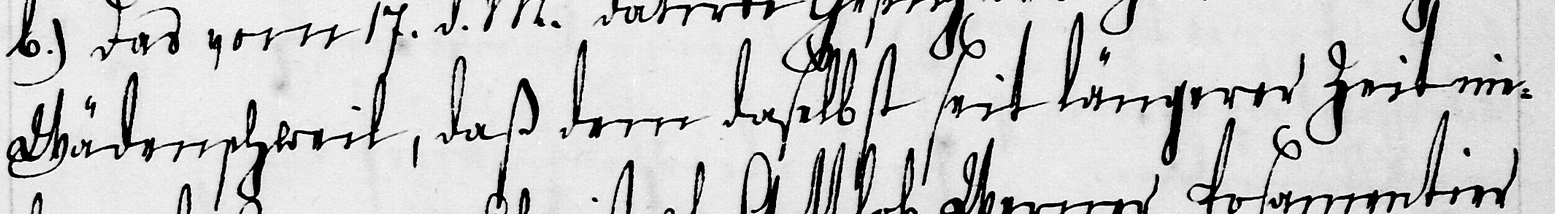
Wädenschweil, daß dem daselbst seit längerer Zeit nie¬
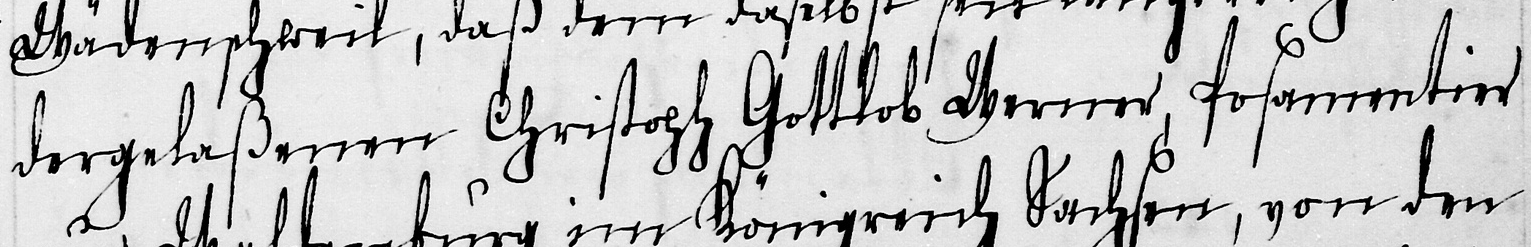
dergelaßenen Christoph Gottlob Werner, von den
